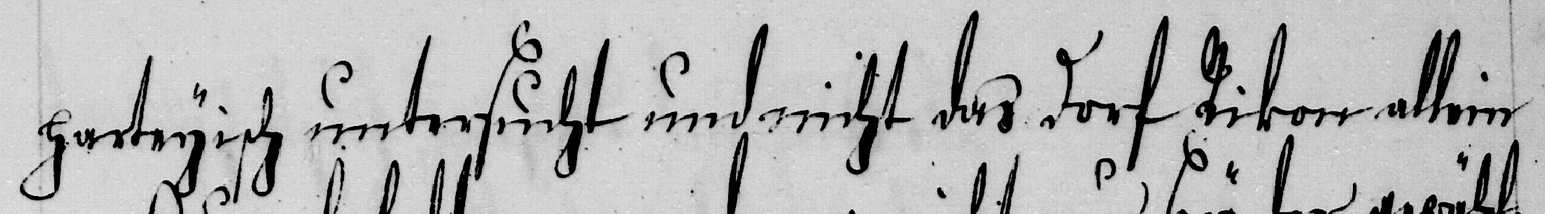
parteyisch untersucht und nicht das Dorf Rikon alle¬
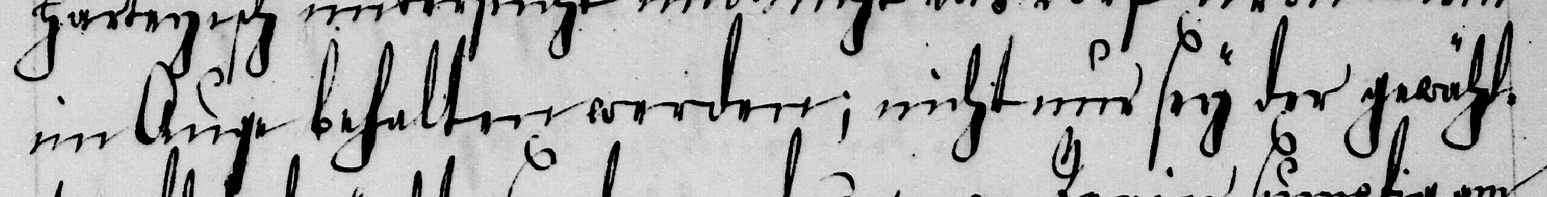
im Auge behalten werden; nicht nur sey der gewähl¬
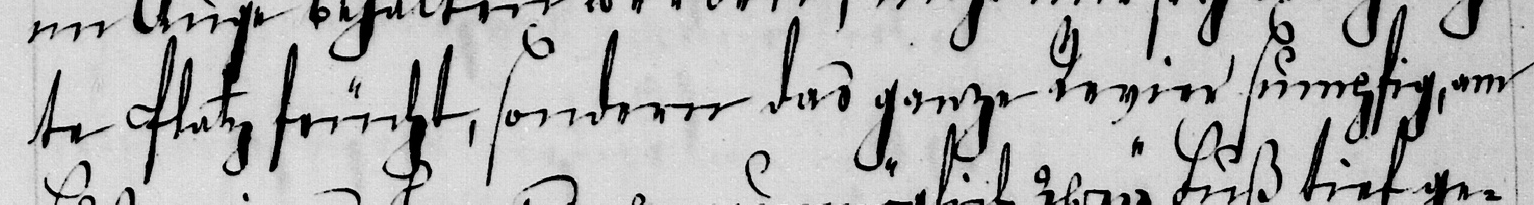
te Platz feucht, sondern das ganze Revier sumpfig, am
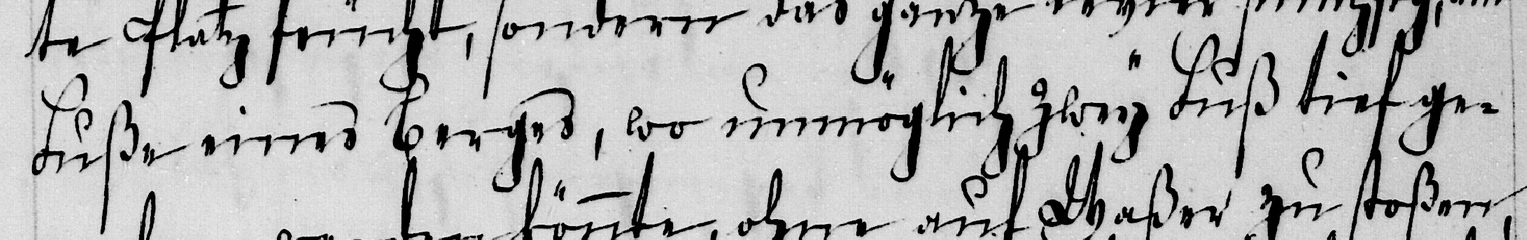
Fuße eines Berges, wo unmöglich zwey Fuß tief ge¬
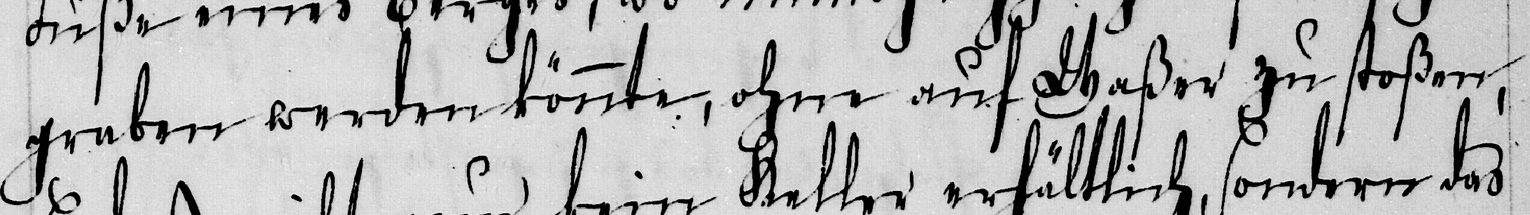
graben werden könnte, ohne auf Waßer zu stoßen,
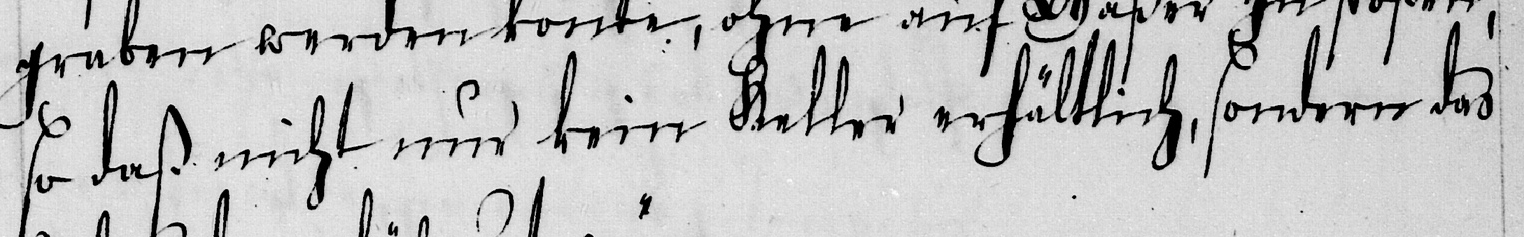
so daß nicht nur kein Keller erhältlich, sondern das
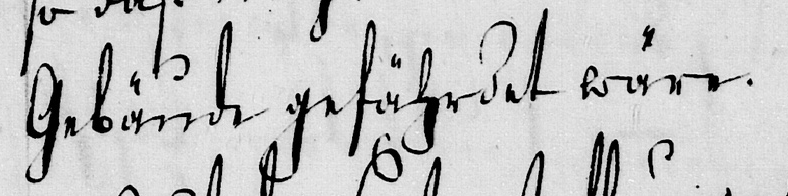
Gebäude gefährdet wäre.
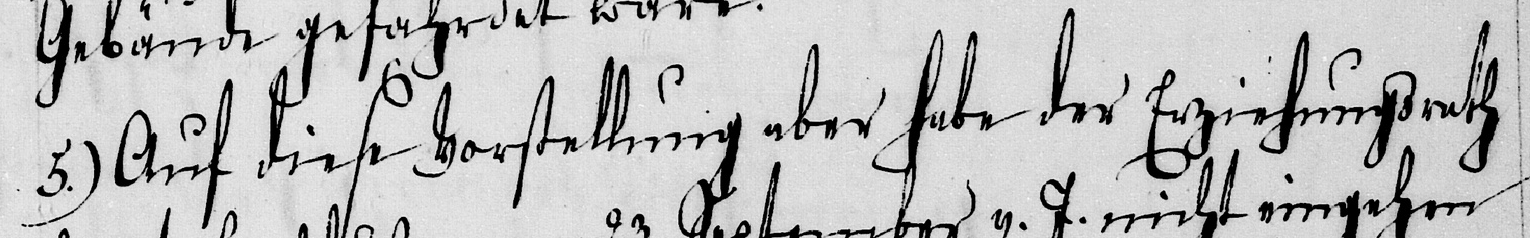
5.) Auf diese Vorstellung aber habe der Erziehungsrath
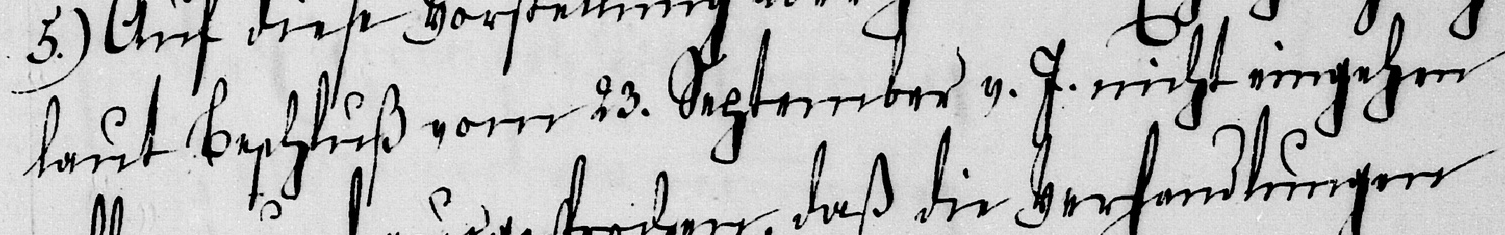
laut Beschluß vom 23. September v. J. nicht eingehen
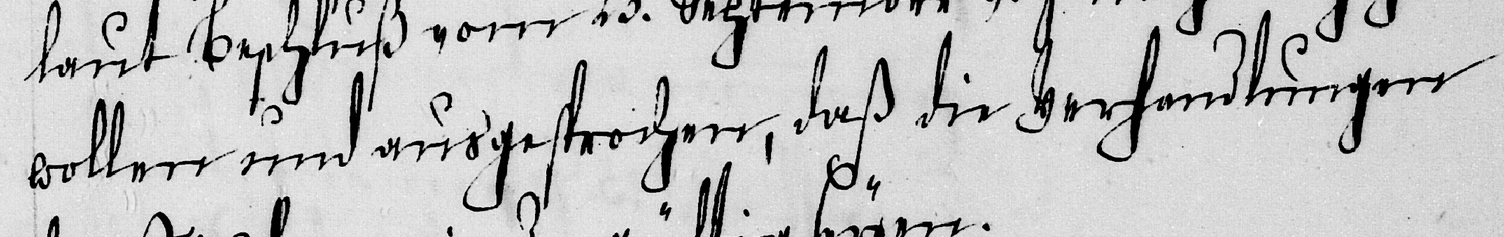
wollen und ausgesprochen, daß die Verhandlungen
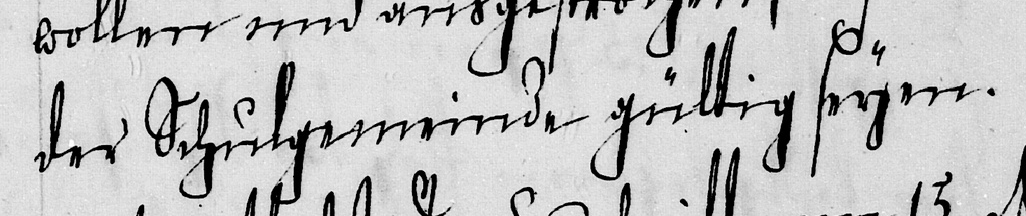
der Schulgemeinde gültig seyen.
